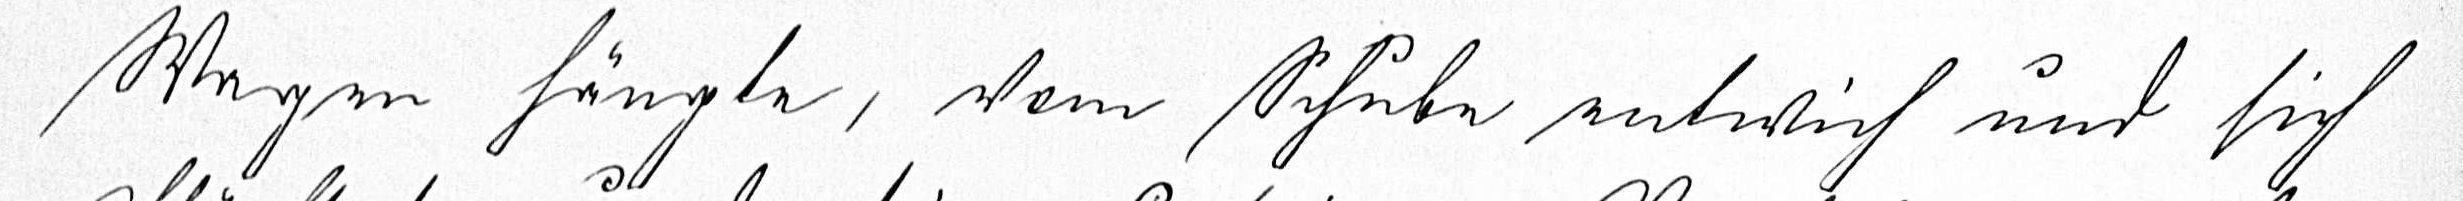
Wagen hängte, vom Schube entwich und sich
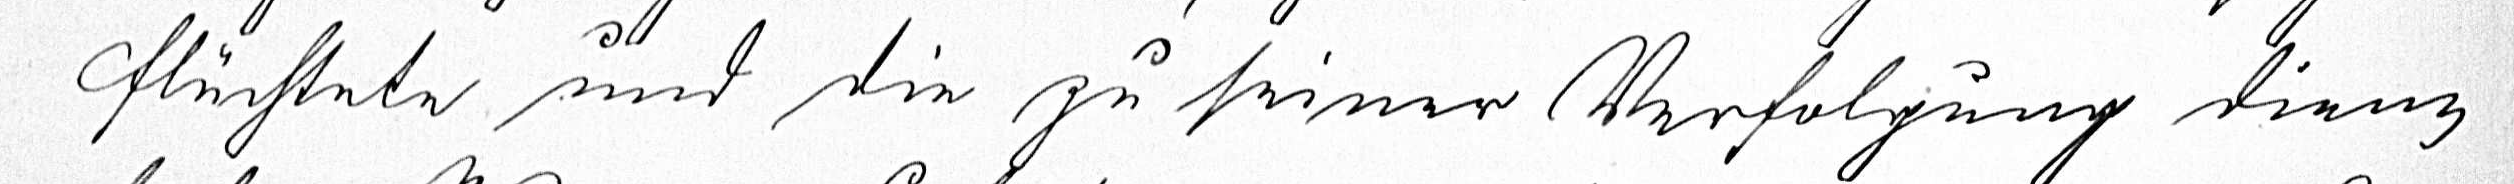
flüchtete und die zu seiner Verfolgung dien¬
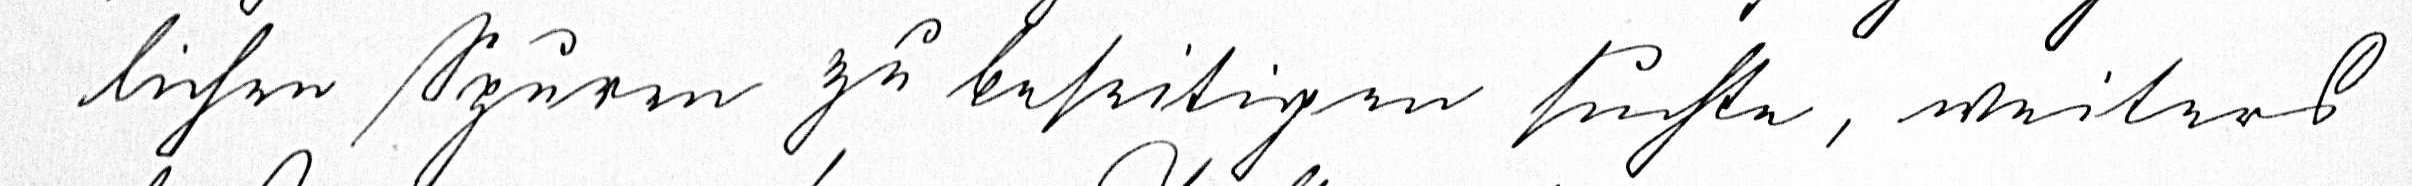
lichen Spuren zu beseitigen suchte, weiters
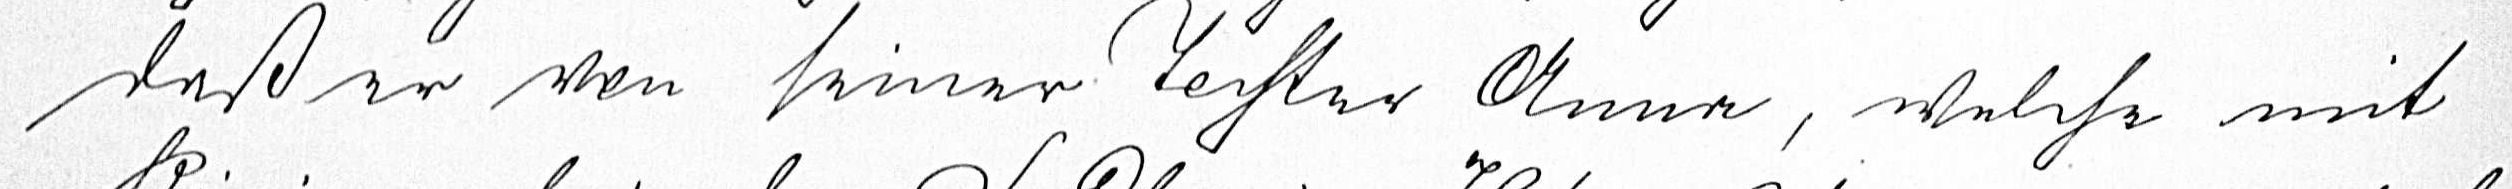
daß er von seiner Tochter Anna, welche mit
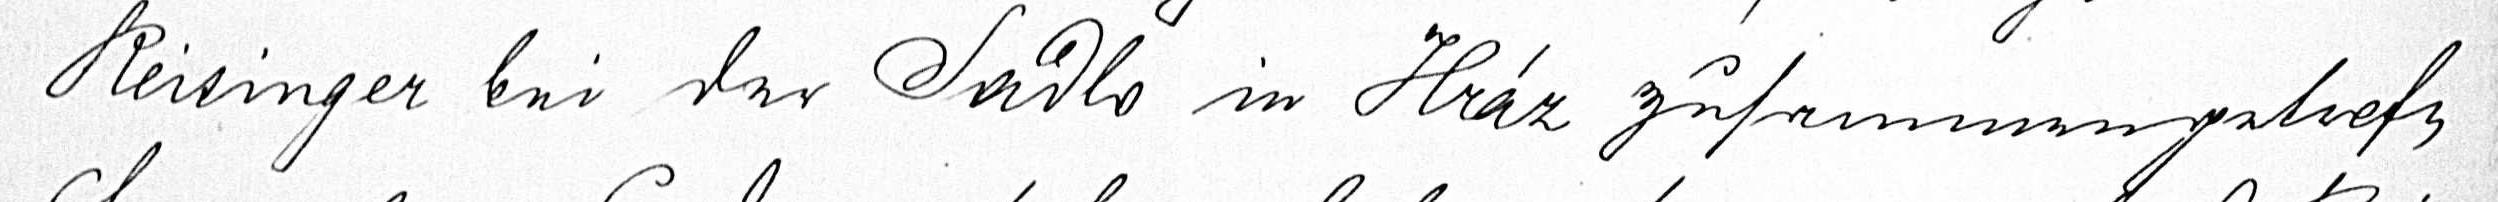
Reisinger bei der Sadlo in Hráz zusammengetrof¬
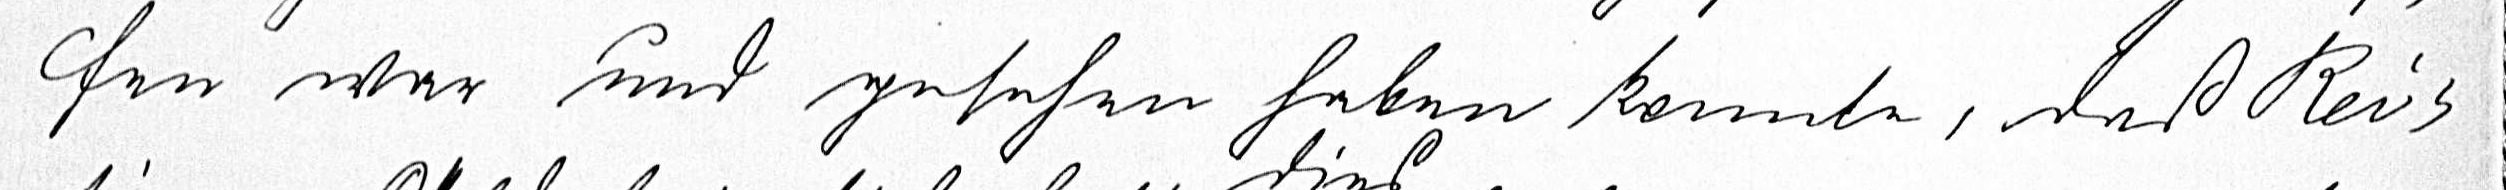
fen war und gesehen haben konnte, daß Rei¬
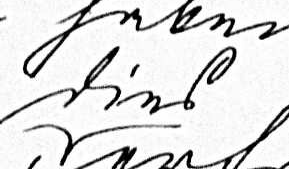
dies
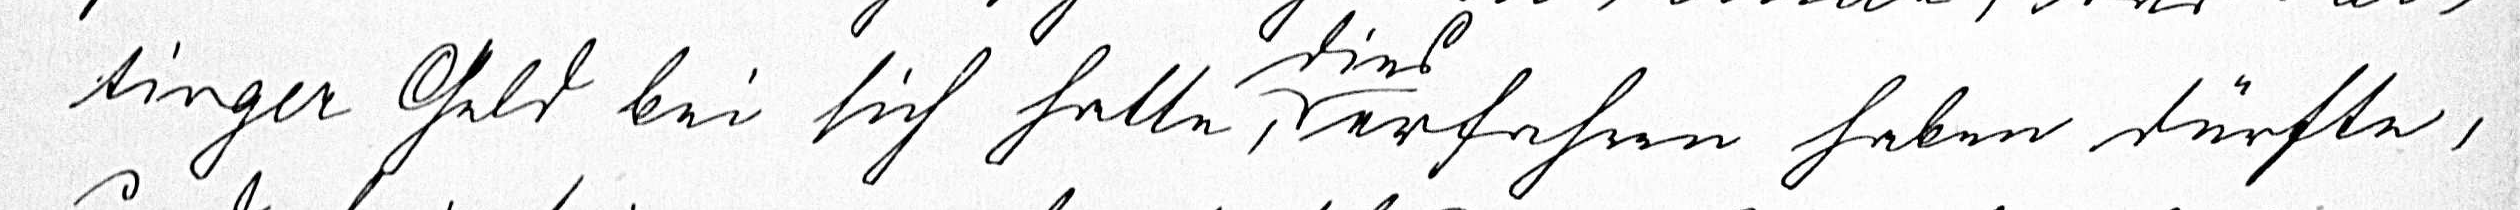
singer Geld bei sich hatte, erfahren haben dürfte,
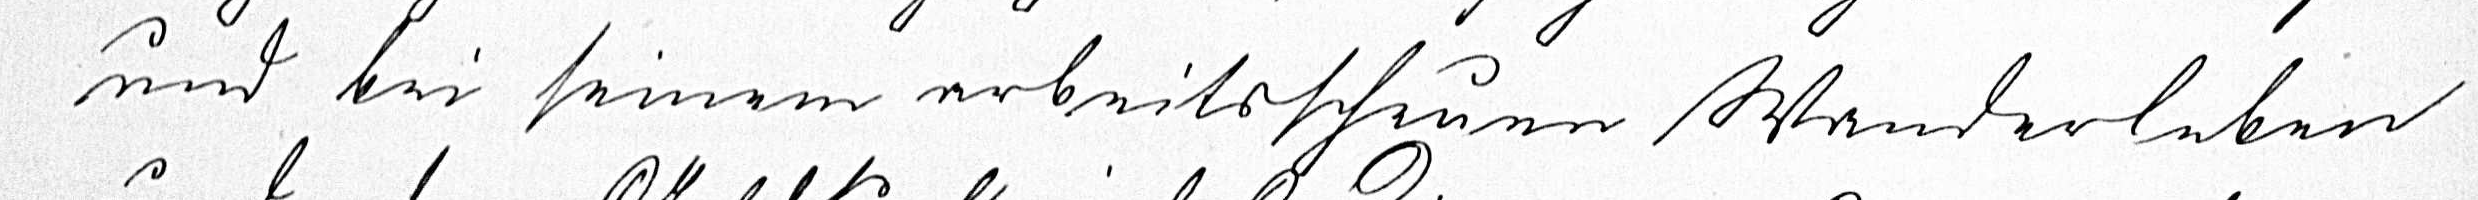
und bei seinem arbeitsscheuen Wanderleben
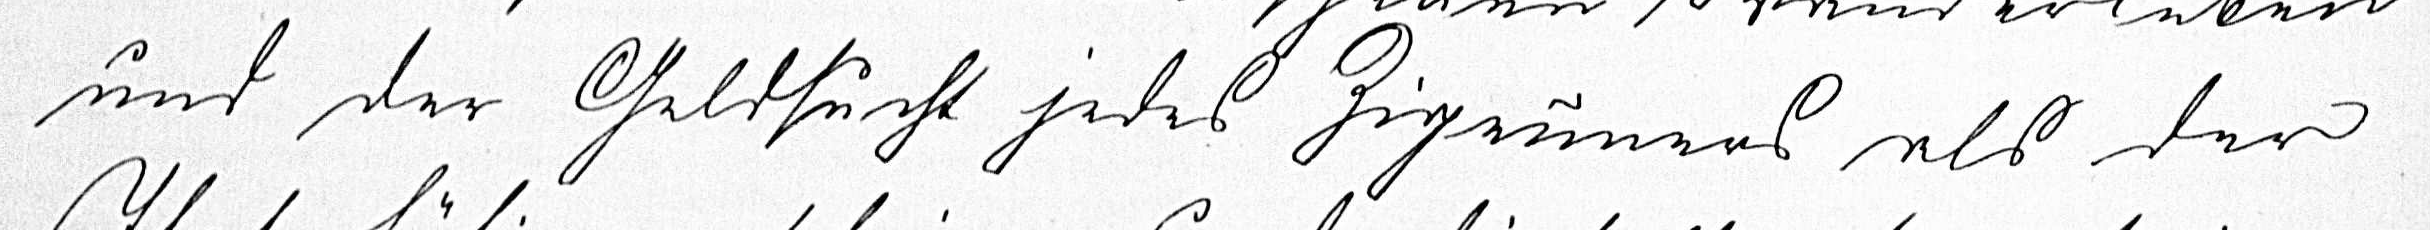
und der Geldsucht jedes Zigeuners als der
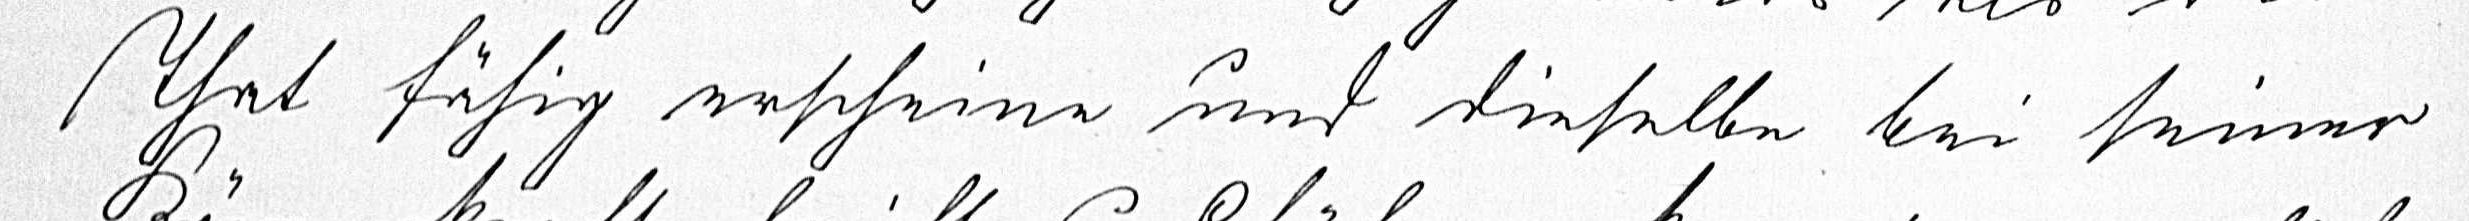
That fähig erscheine und dieselbe bei seiner
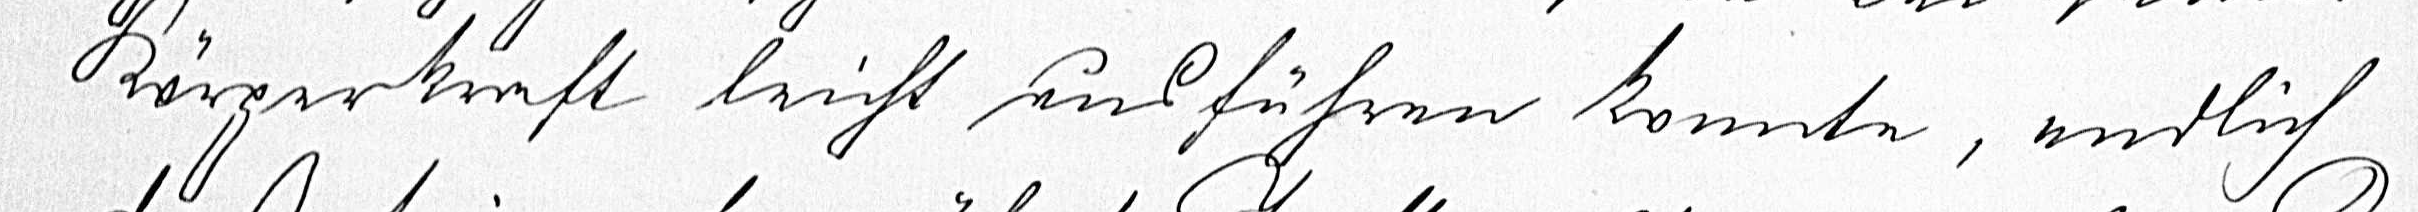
Körperkraft leicht ausführen konnte, endlich
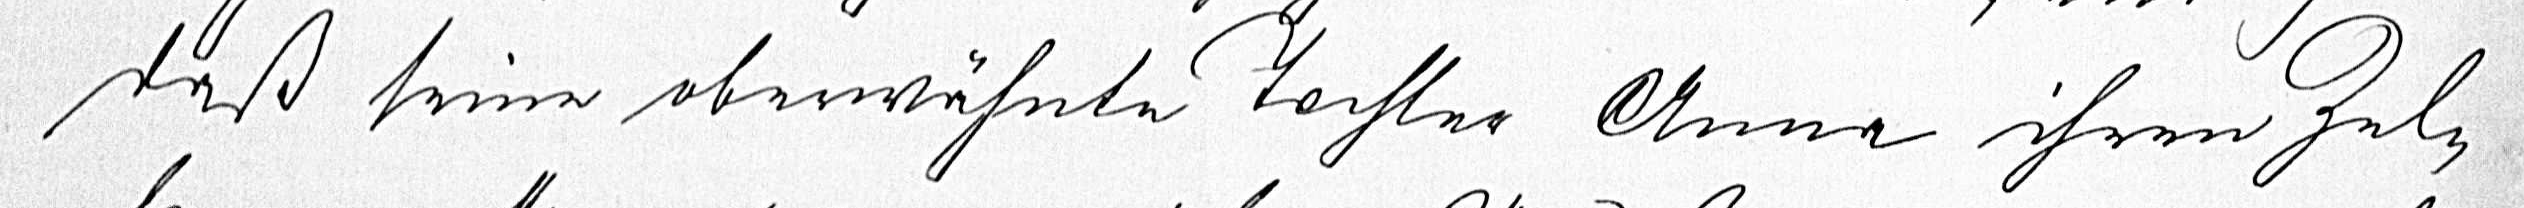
daß seine oberwähnte Tochter Anna ihren Zel¬
